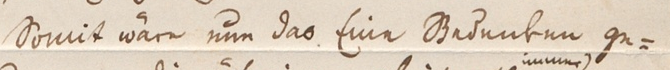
Somit wäre nun das Eine Bedenken ge-
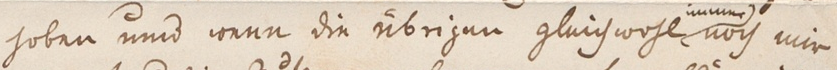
hoben und wenn die übrigen gleichwohl immer noch mir
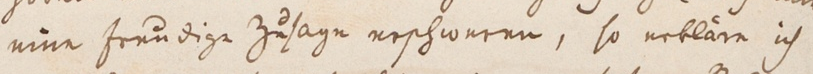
eine freudige Zusage erschweren, so erkläre ich
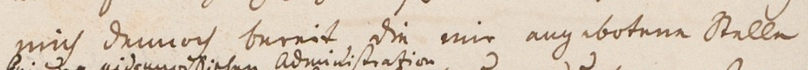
mich dennoch bereit, die mir angebotene Stelle
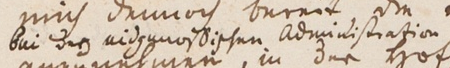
bei der eidgenössischen Administration
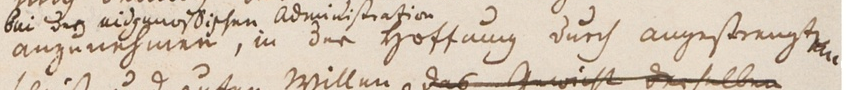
anzunehmen, in der Hoffnung durch angestrengten
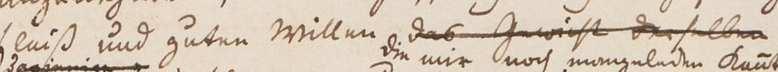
Fleiß und guten Willen das Gewicht derselben
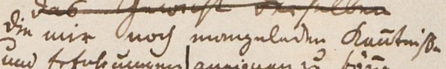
die mir noch mangelnden Kenntnisse
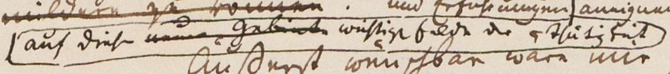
auf diesem neuen Gebiete wichtigen Felde der Thätigkeit aneignen zu
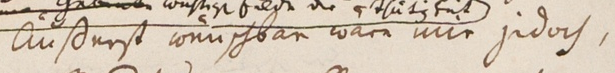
Äußerst wünschbar wäre mir jedoch,
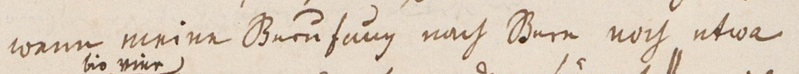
wenn meine Berufung nach Bern noch etwa
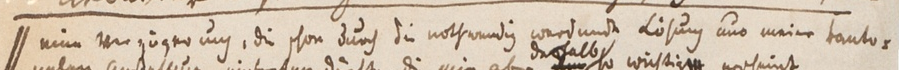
// eine Verzögerung, die schon durch die nothwendig werdende Lösung aus meiner kanto-
